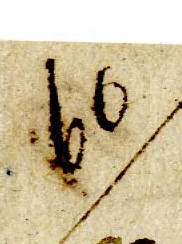60
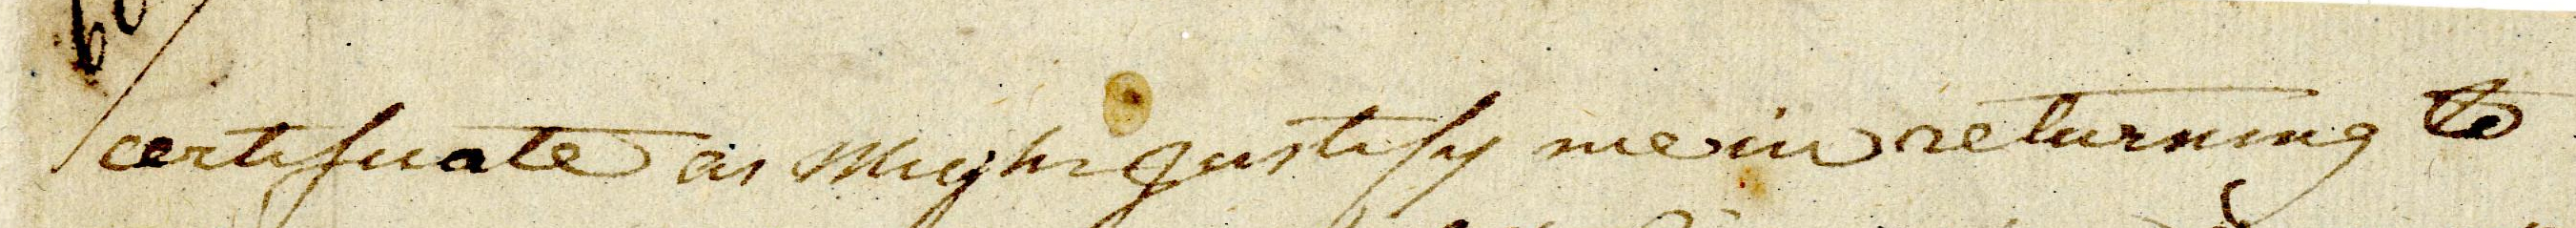Certificate as might justify me in returning to
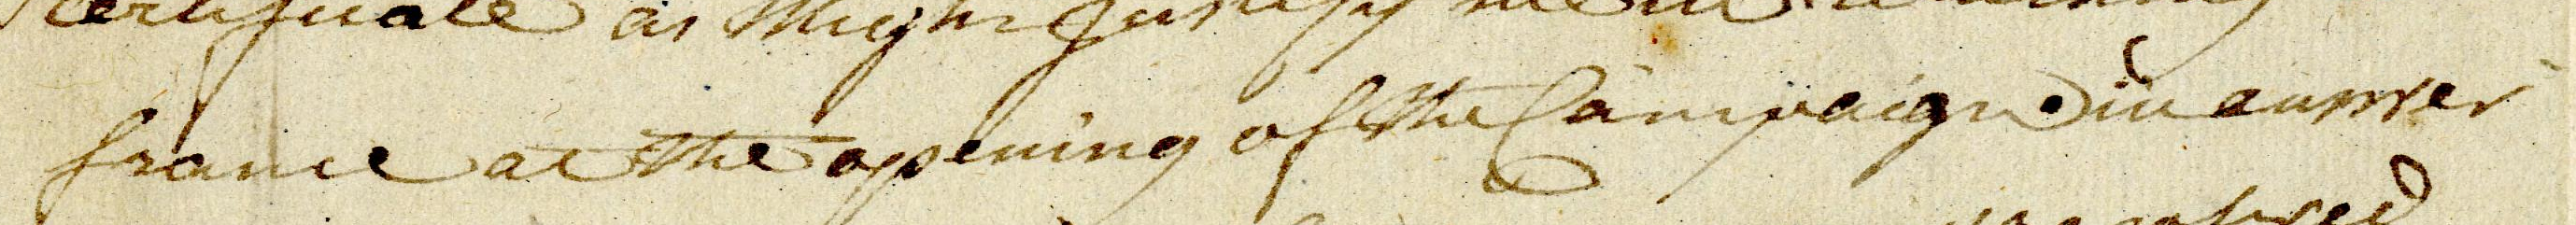france at the opening of the Campaign in answer
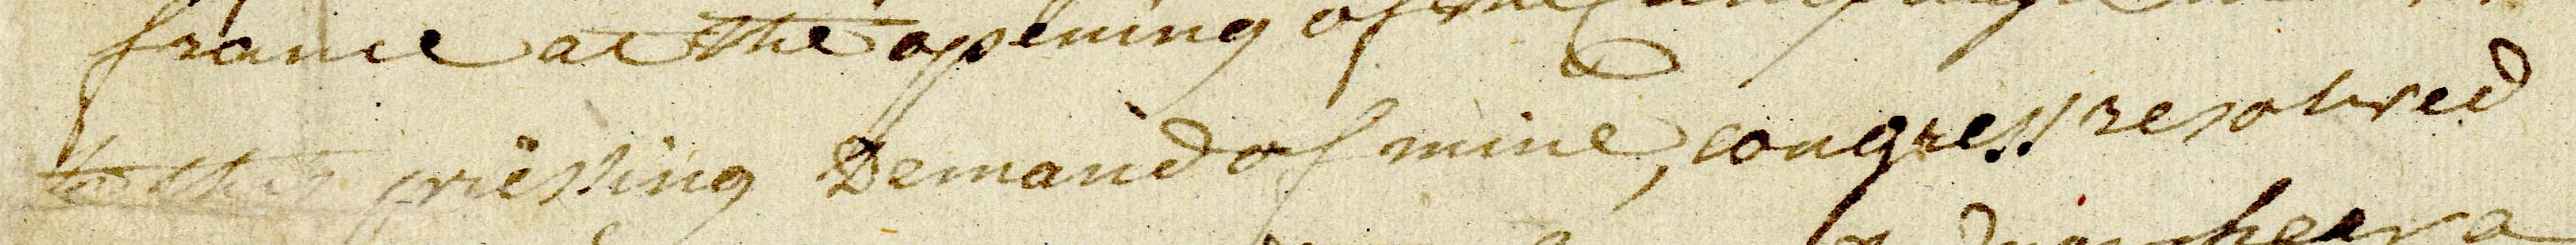to this pressing Demand of mine congress resorted
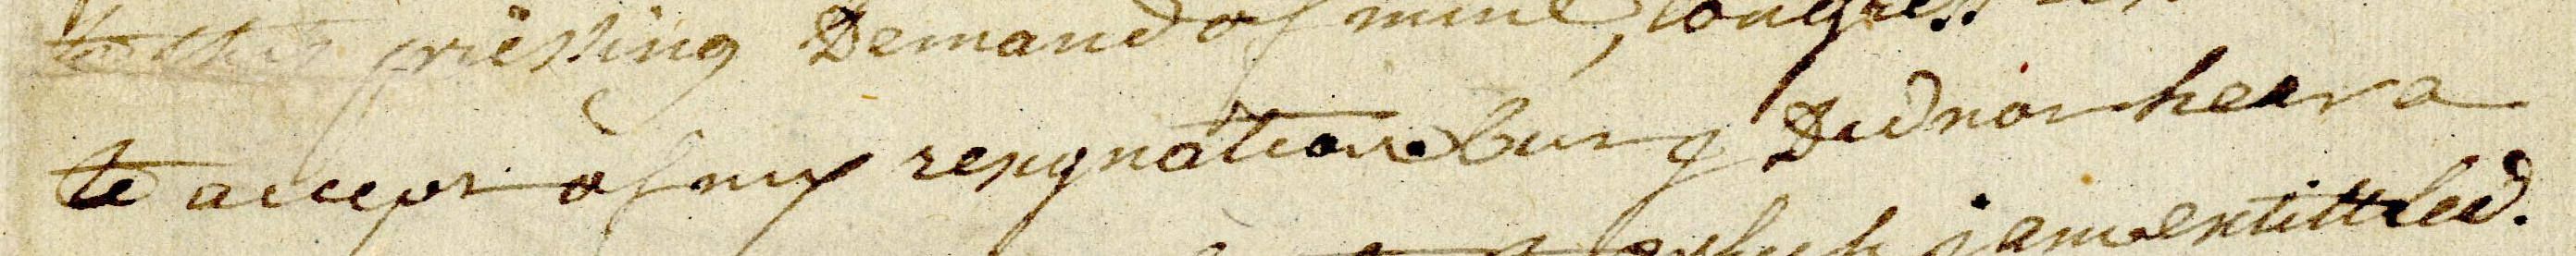to accept of my resignation being Did not hear a
